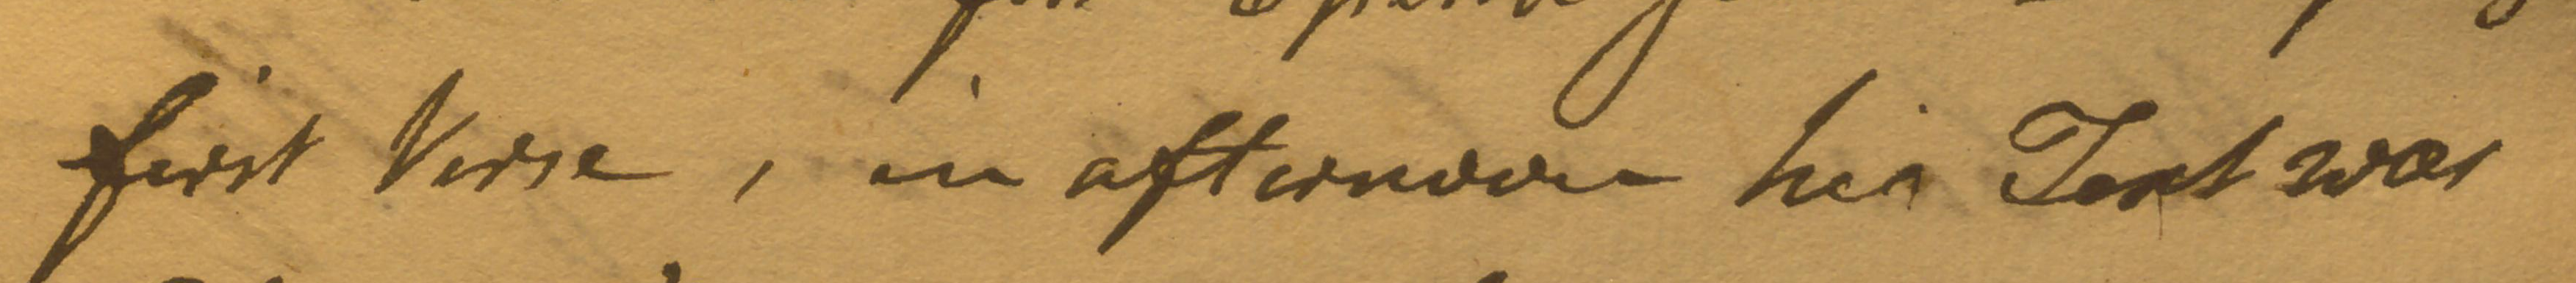first Verse, in afternoon his Text was
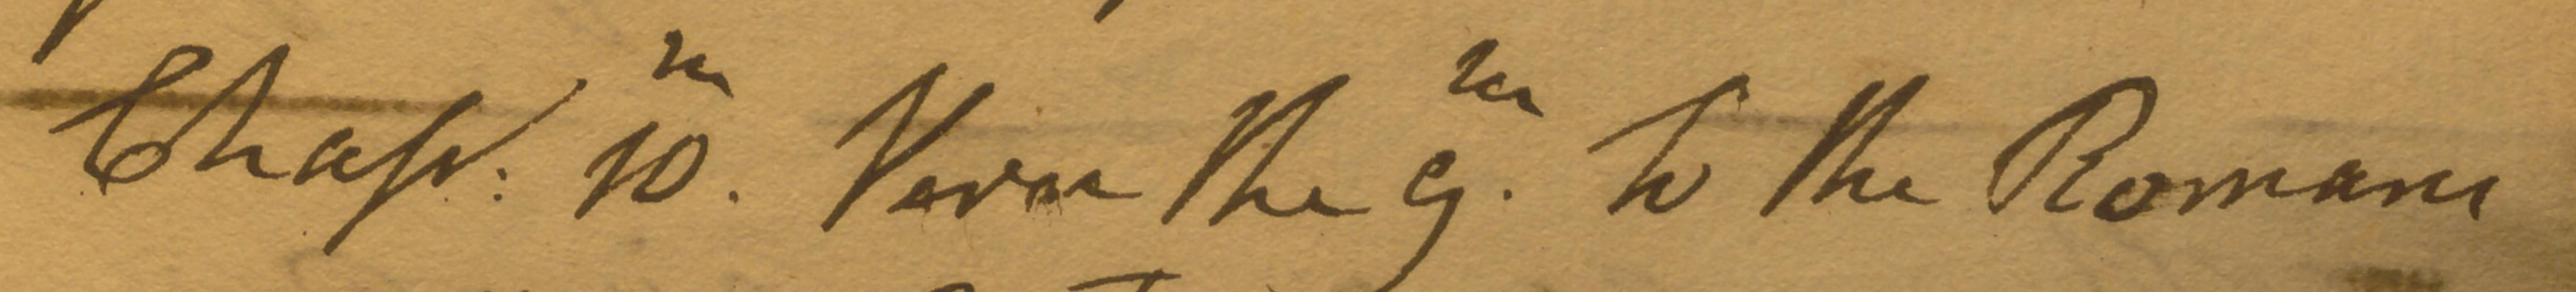Chap. 10^th. Verse the 9^th. to the Romans
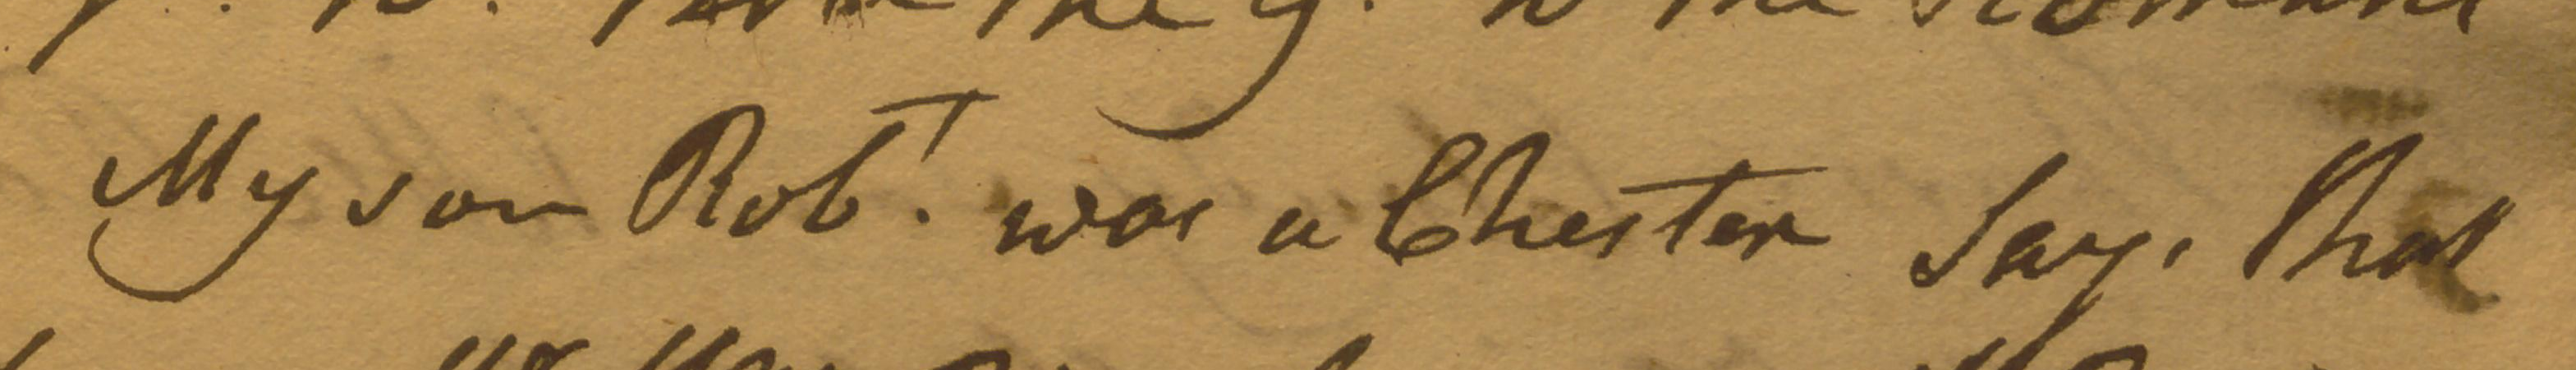My son Rob^t. was a Chester says that
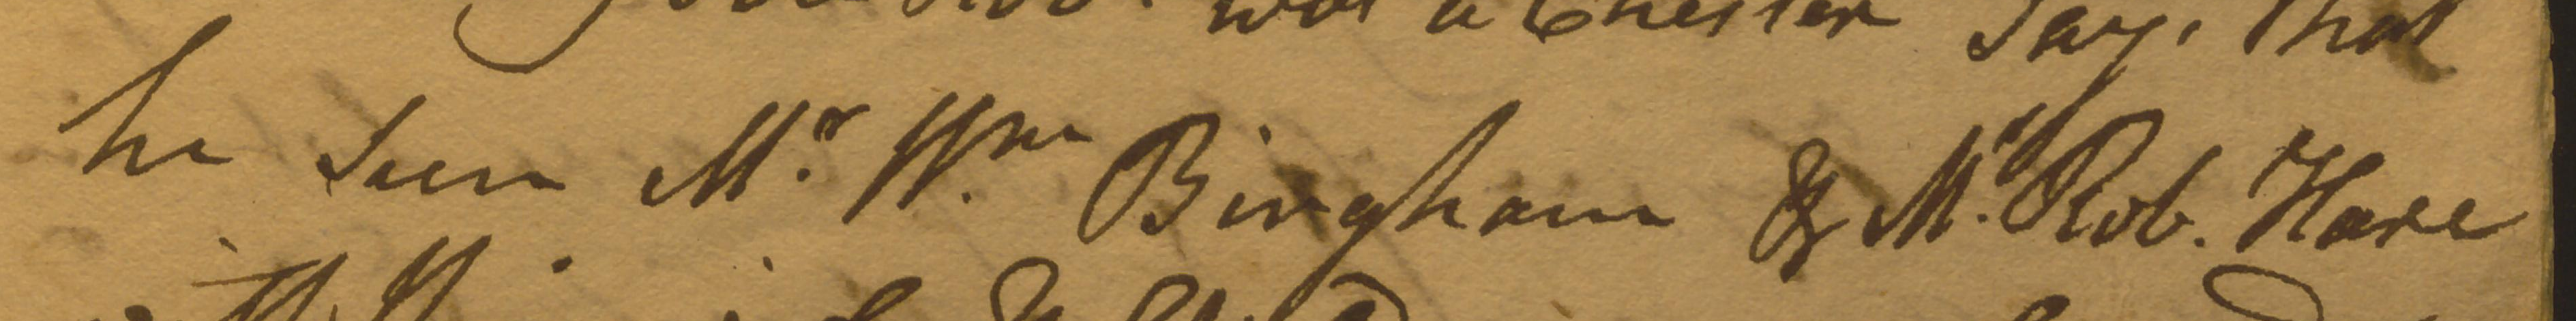he seen M^r. W^m. Bingham & M^r. Rob. Hare
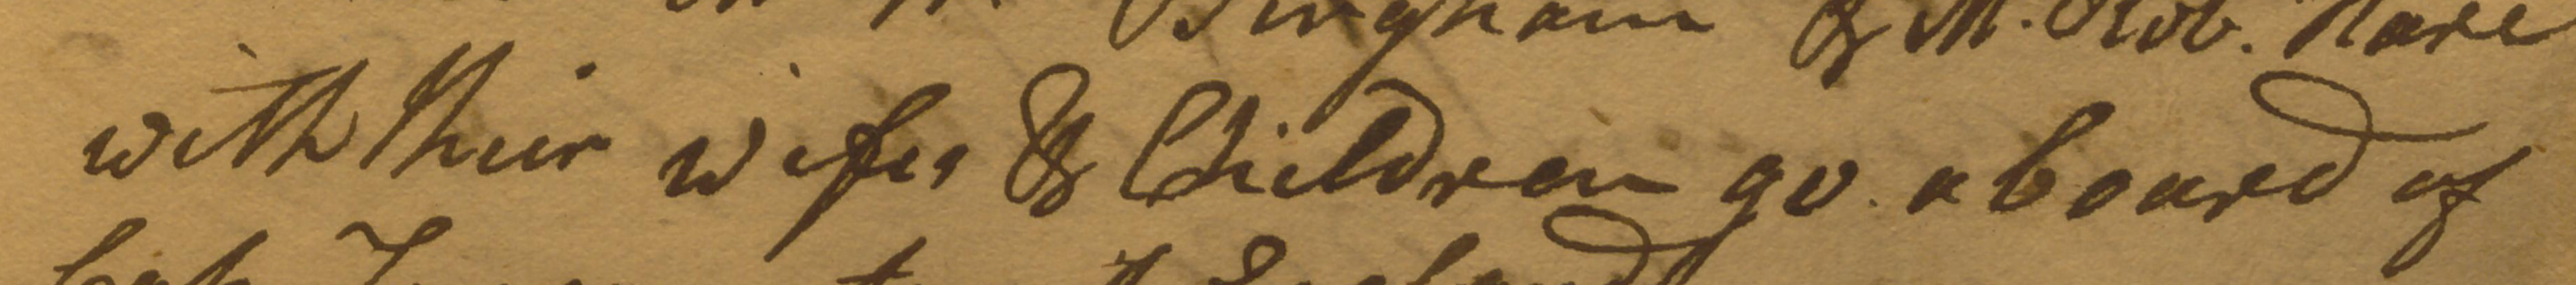with their wifes & Children go aboard of
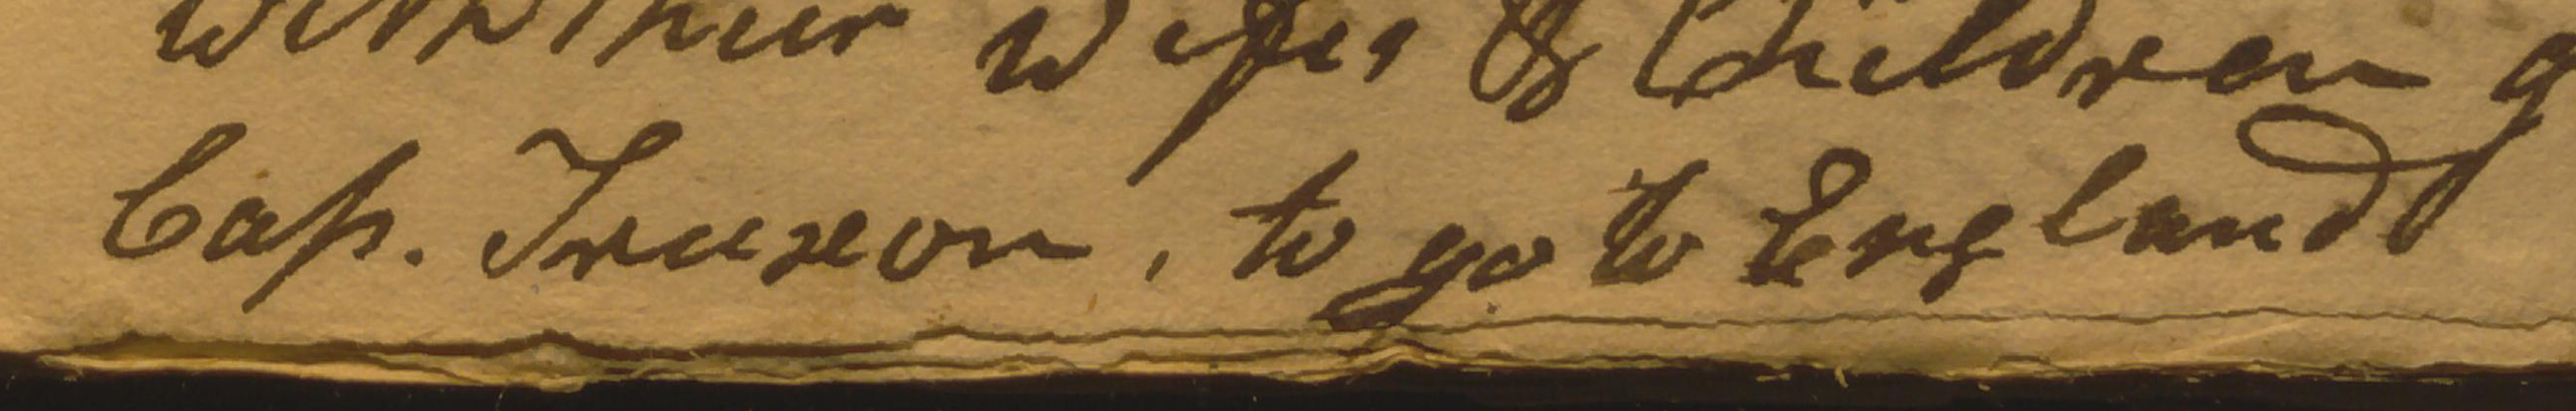Cap. Traxon, to go to England
